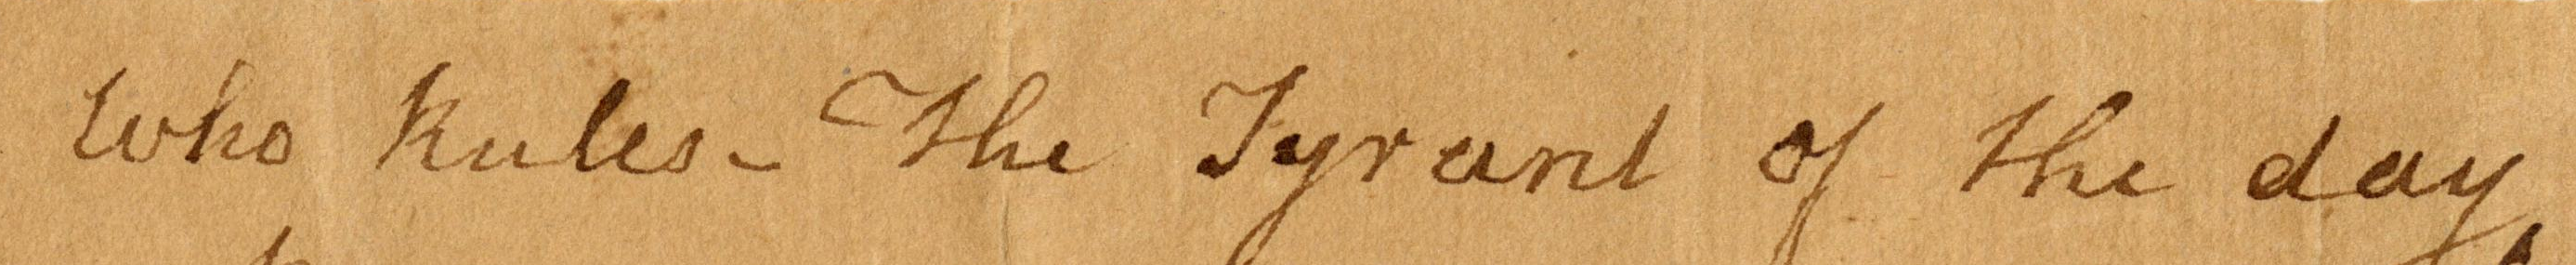Who Rules- The Tyrant of the day,
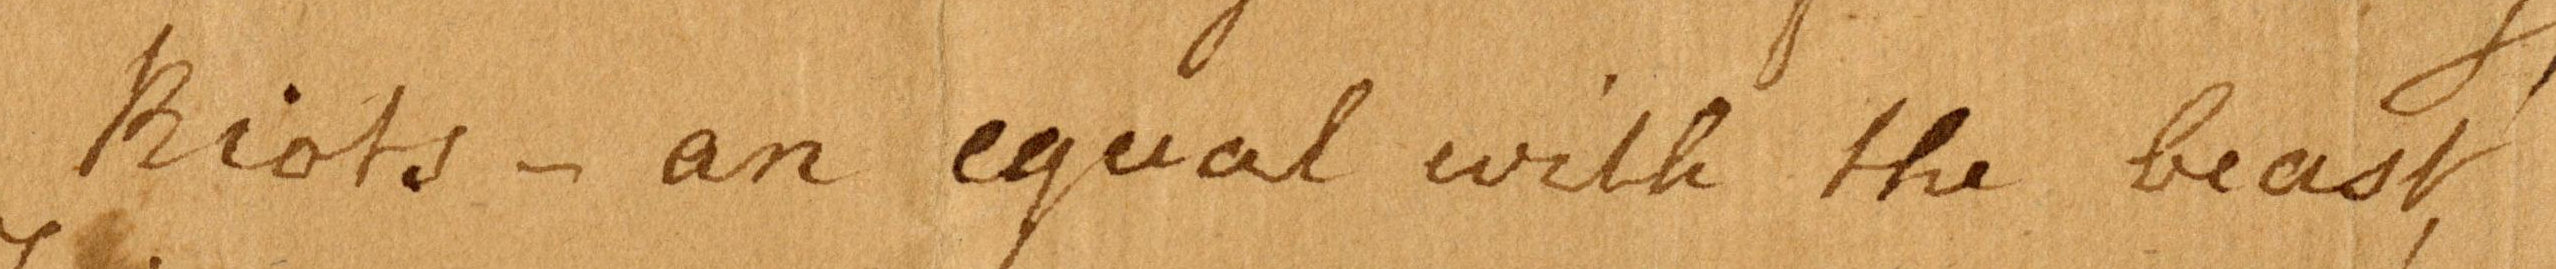Riots- an equal with the beast,
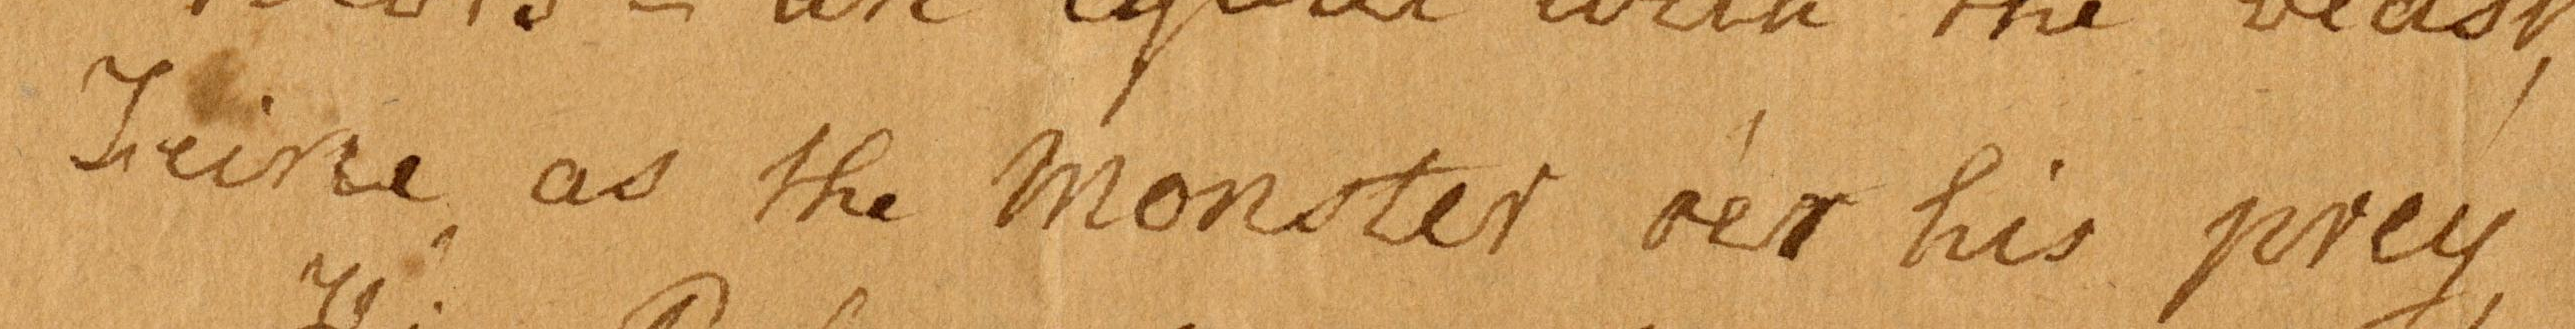Feirce as the Monster o'er his prey,
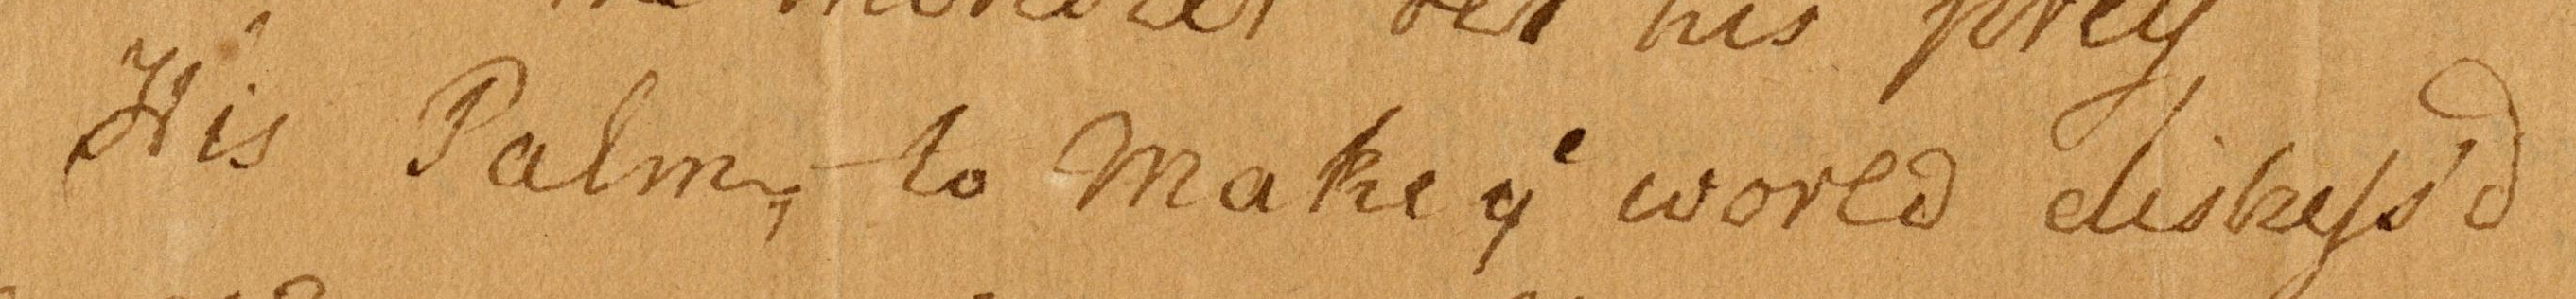His Palm,- to Make y^e world distress'd
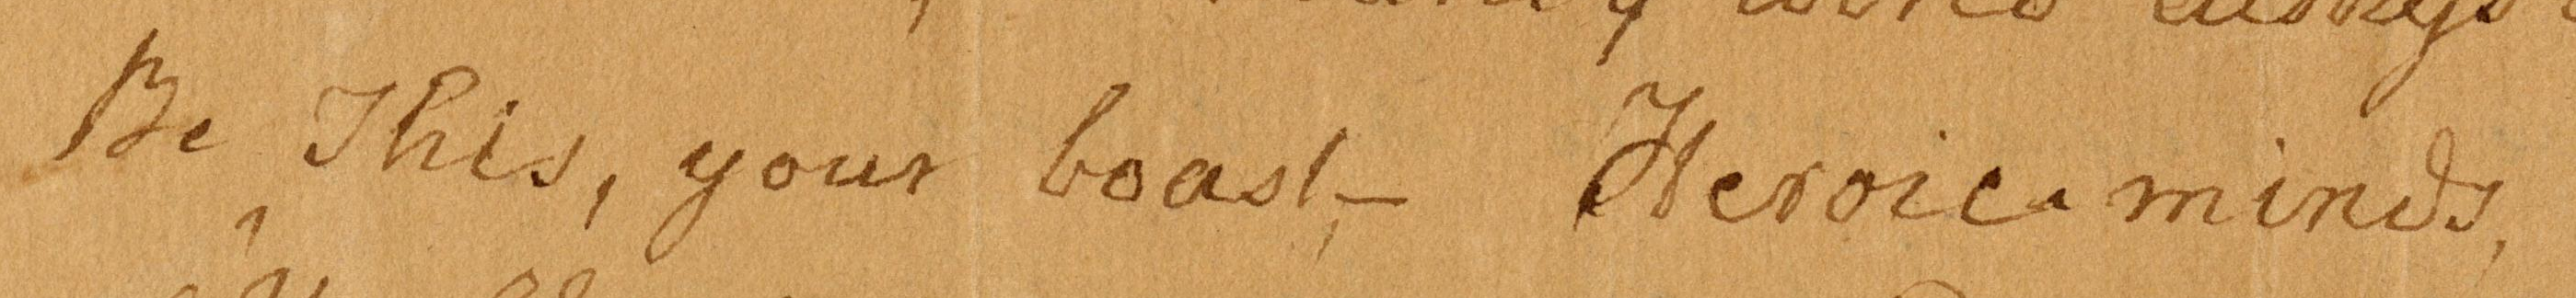Be This, your boast- Heroic minds,
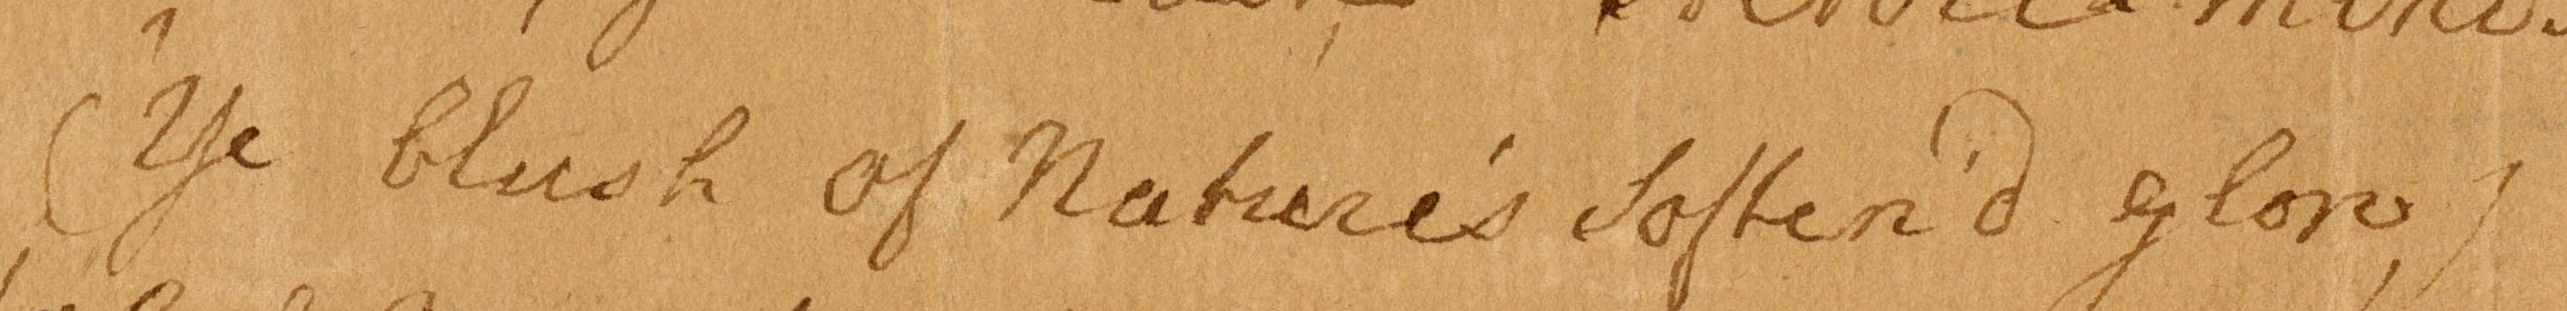(Ye blush of Nature's Soften'd glow,)
